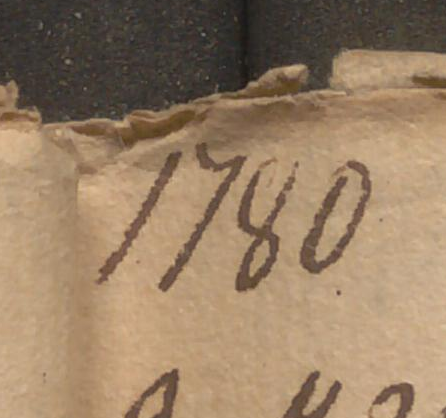1780
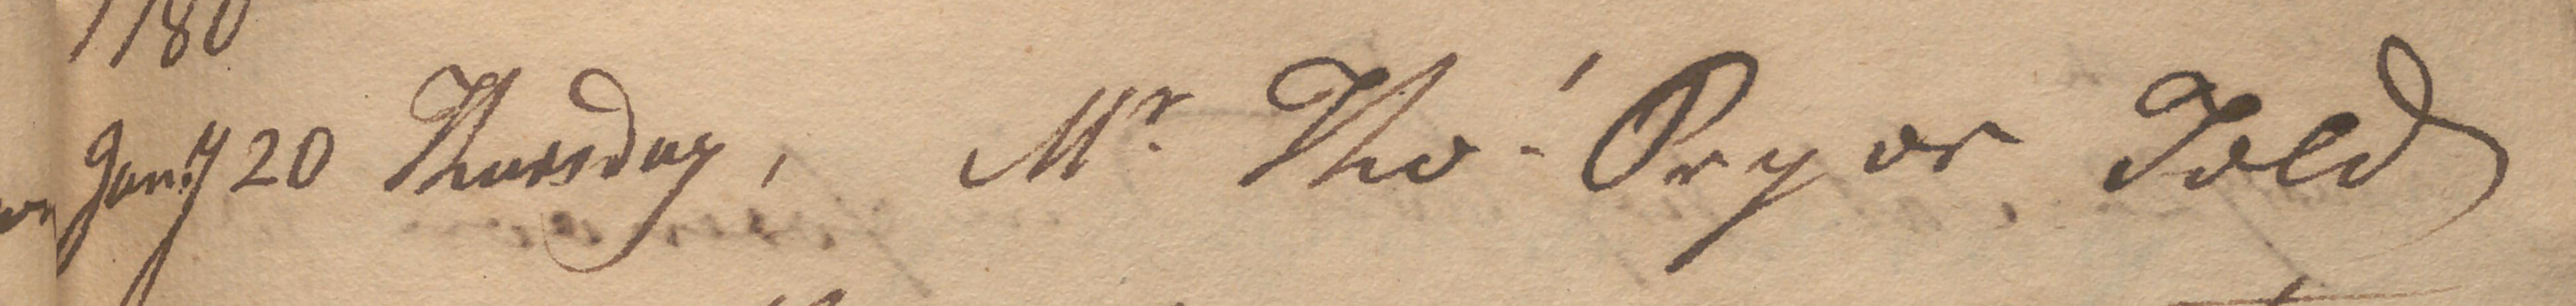Jan^y 20 Thursday, M^r. Tho^s. Pryor Told
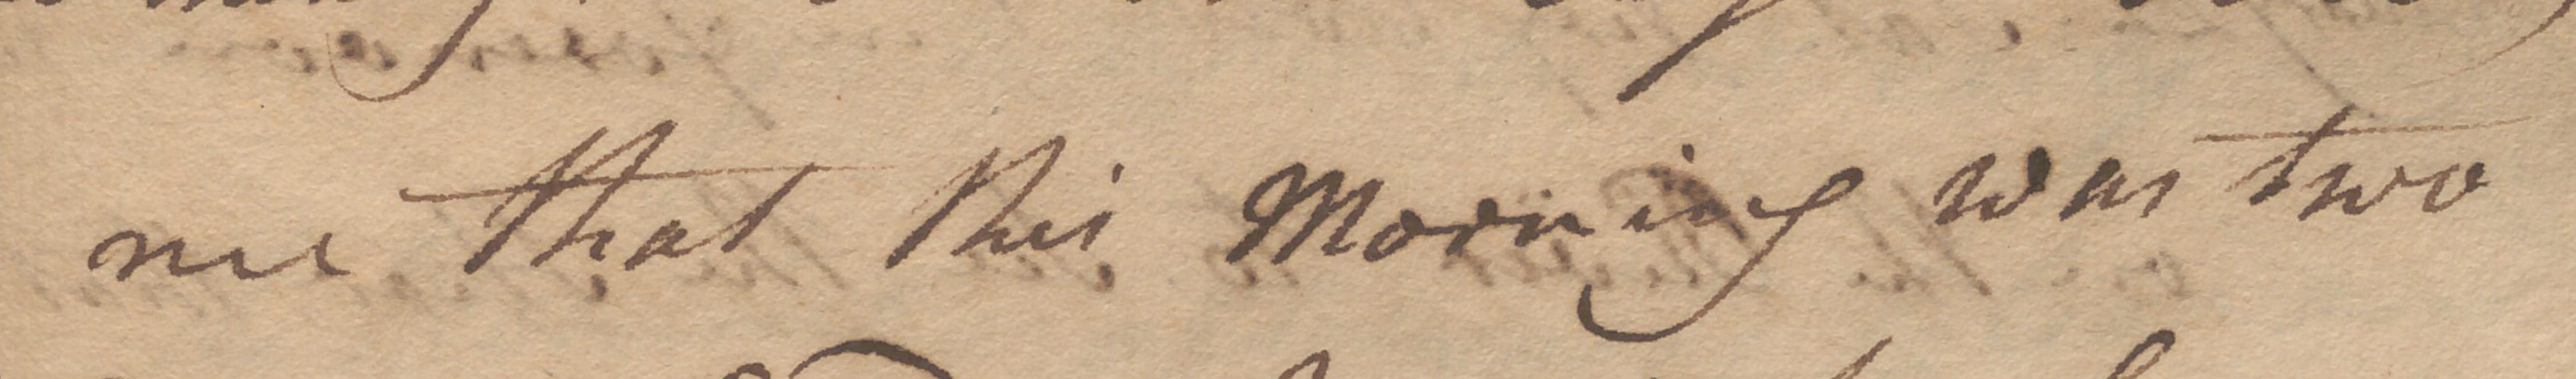me that this morning was two
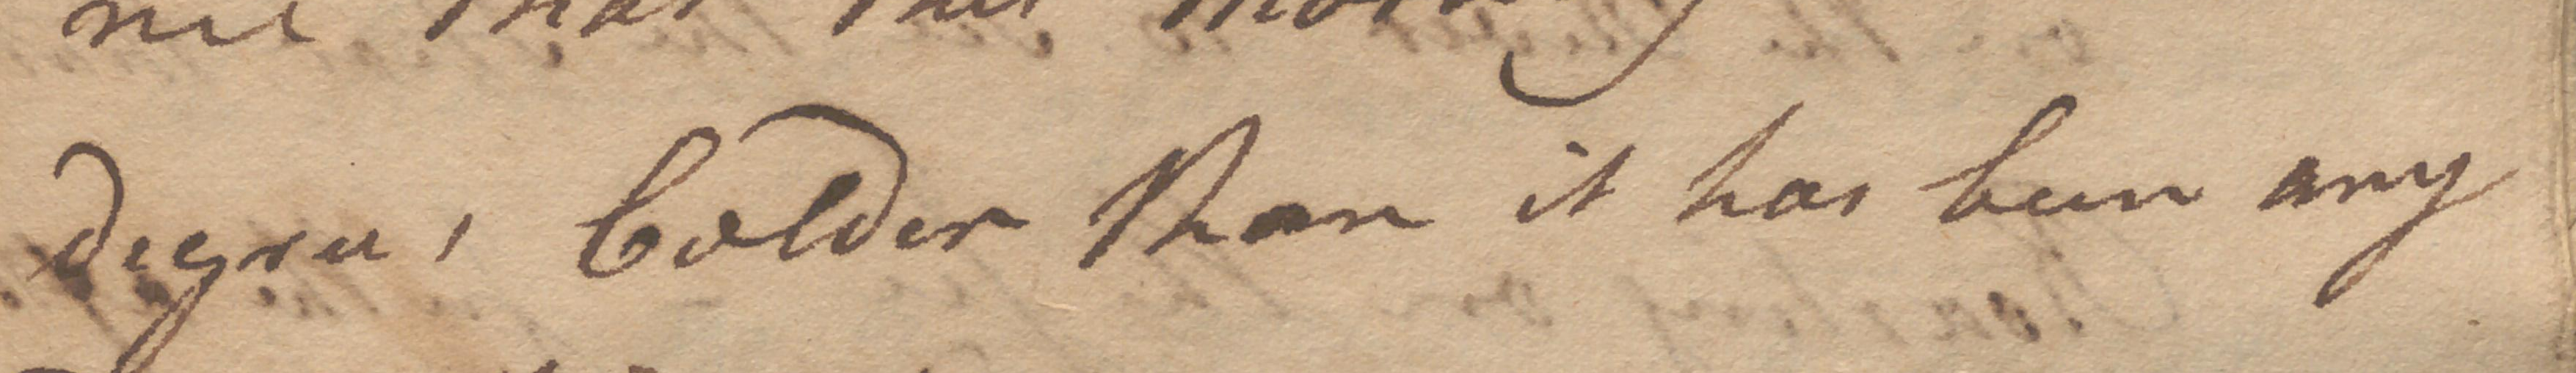degrees Colder than it has been any
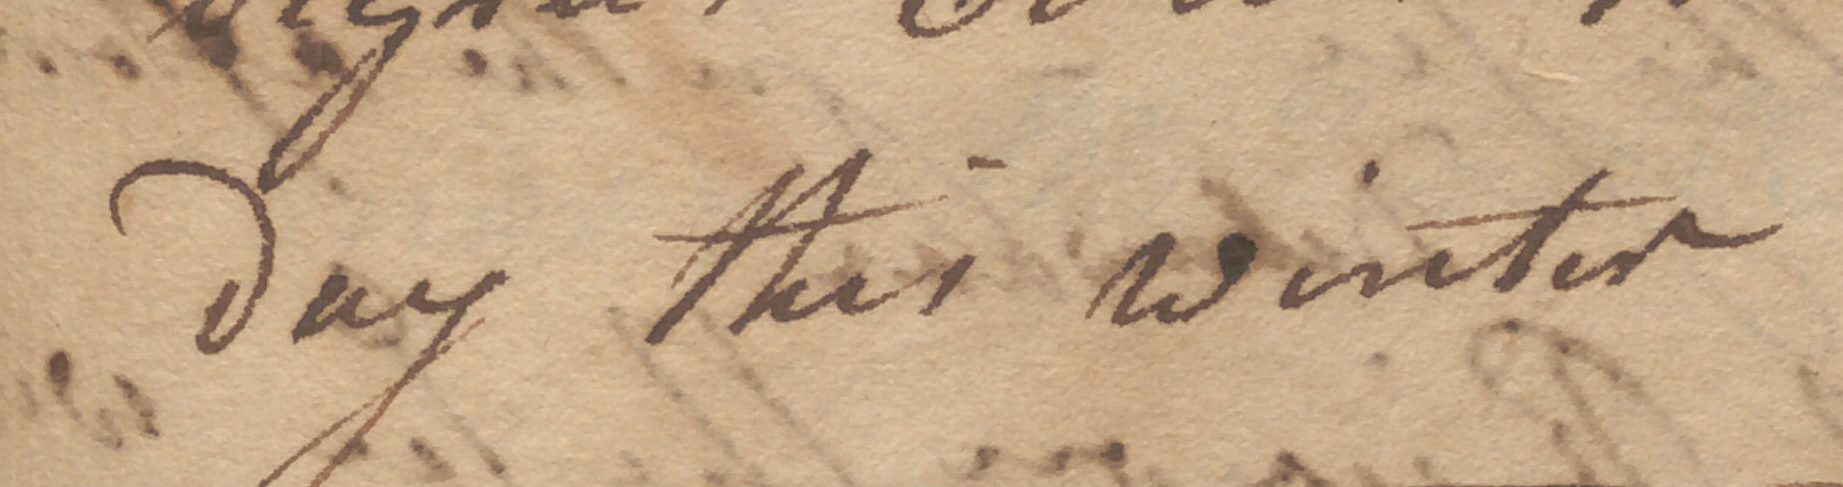day this winter
